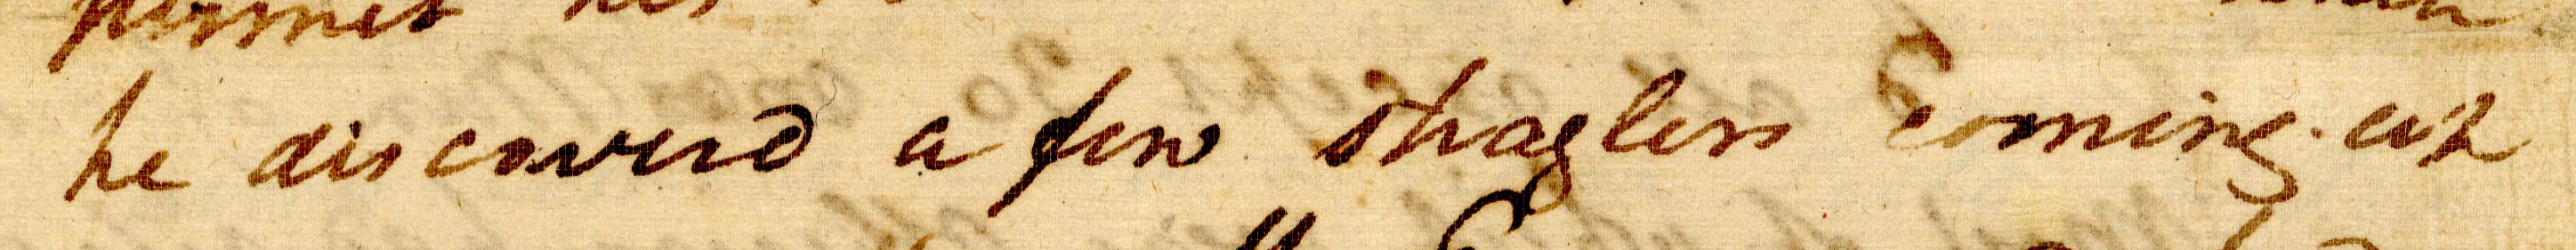he discovered a few straglers coming up
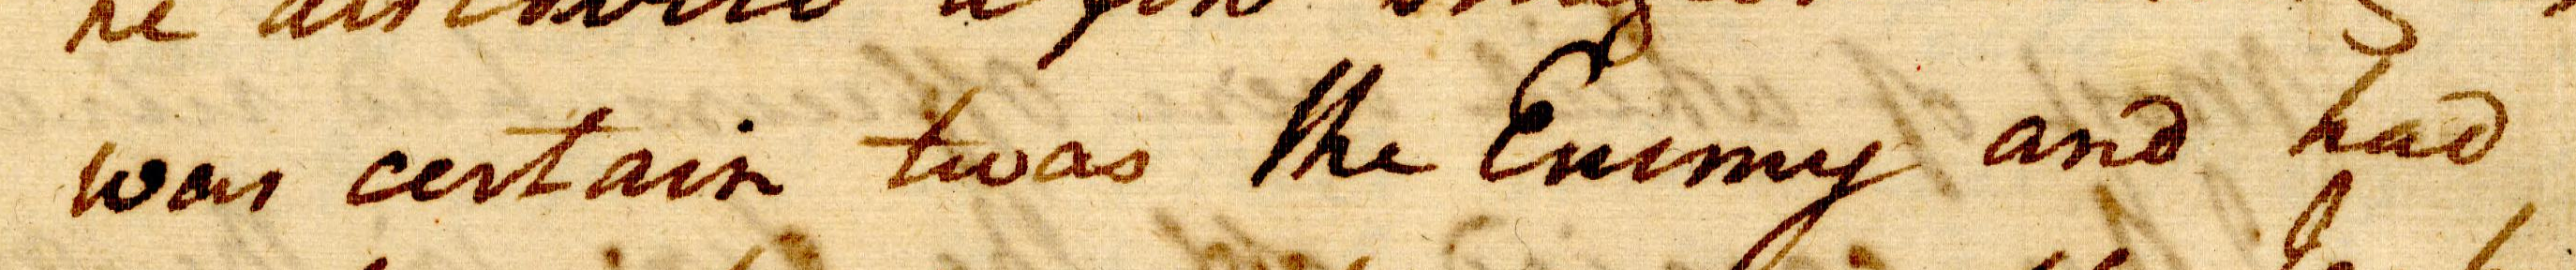was certain twas the Enemy and had
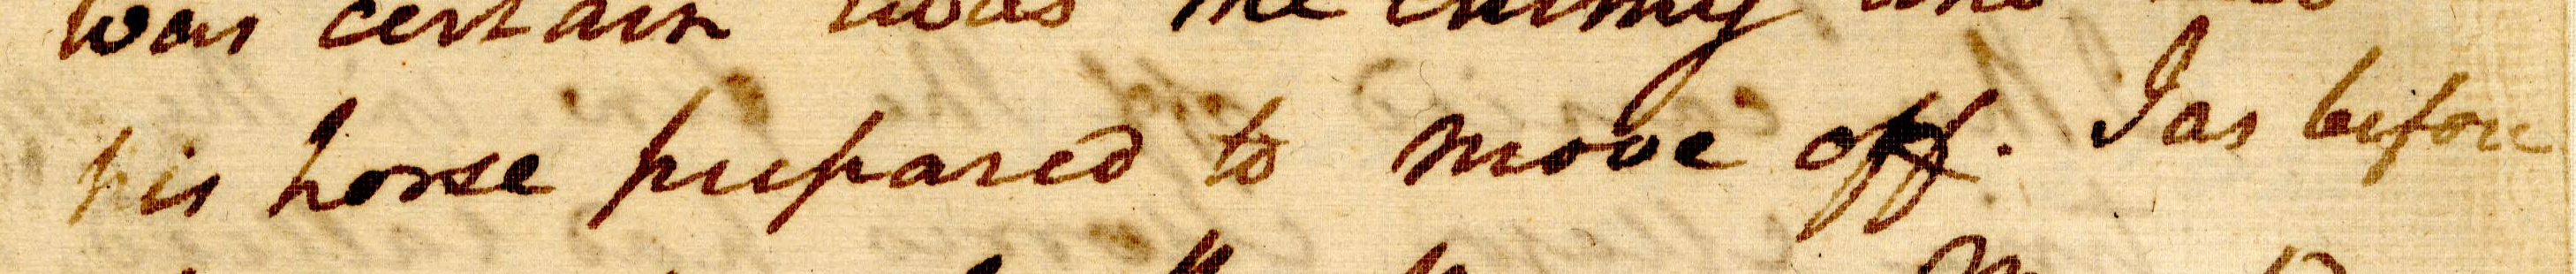his horse prepared to move off. I as before
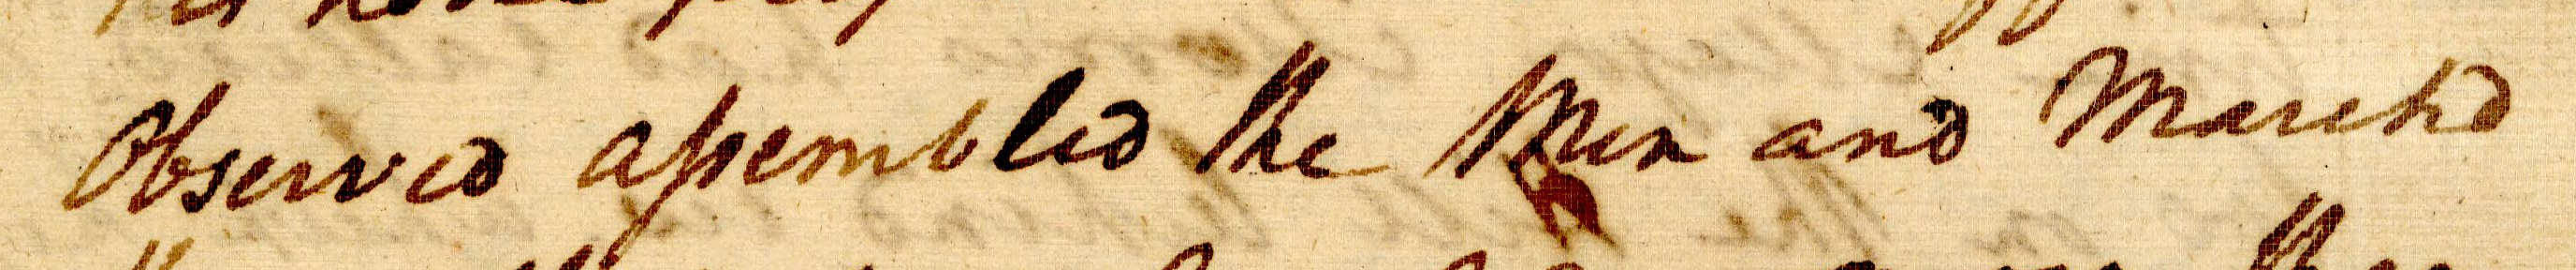Observed assembled the Men and Marchd
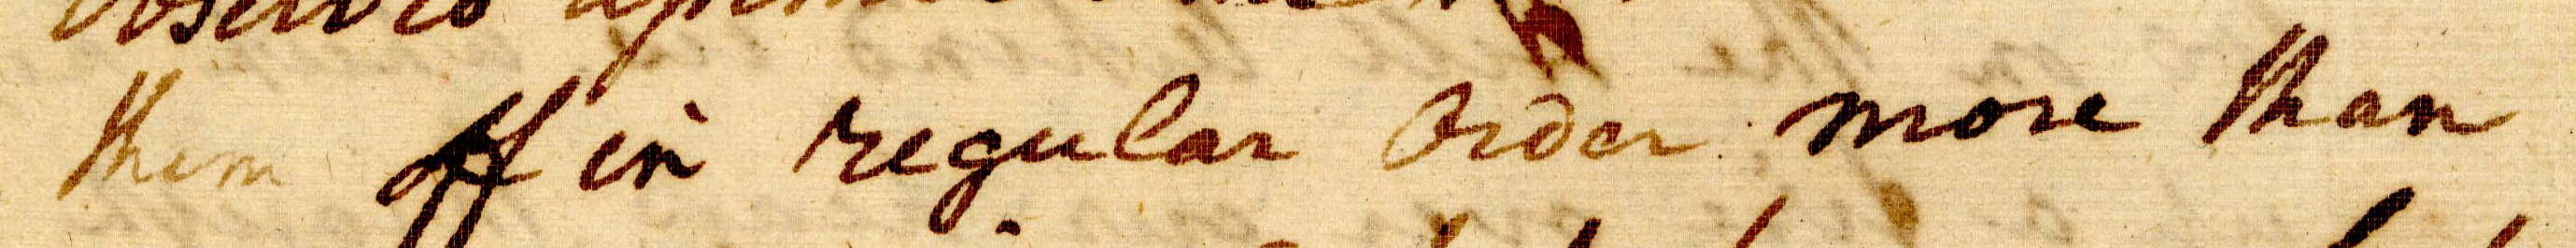them off in regular order more than
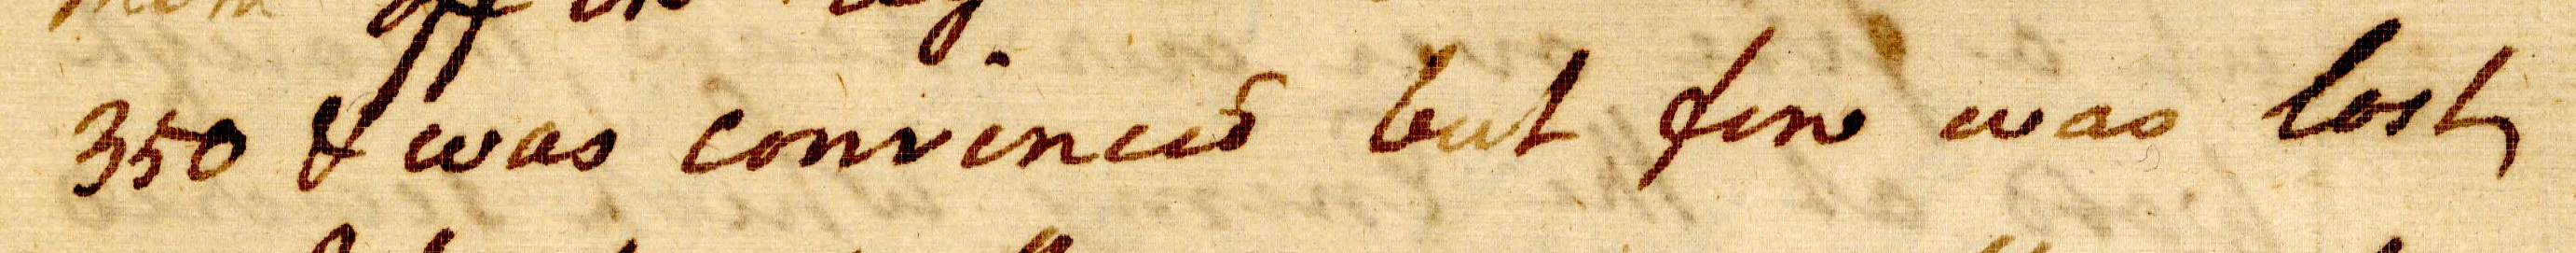350 & was convinced but few was lost
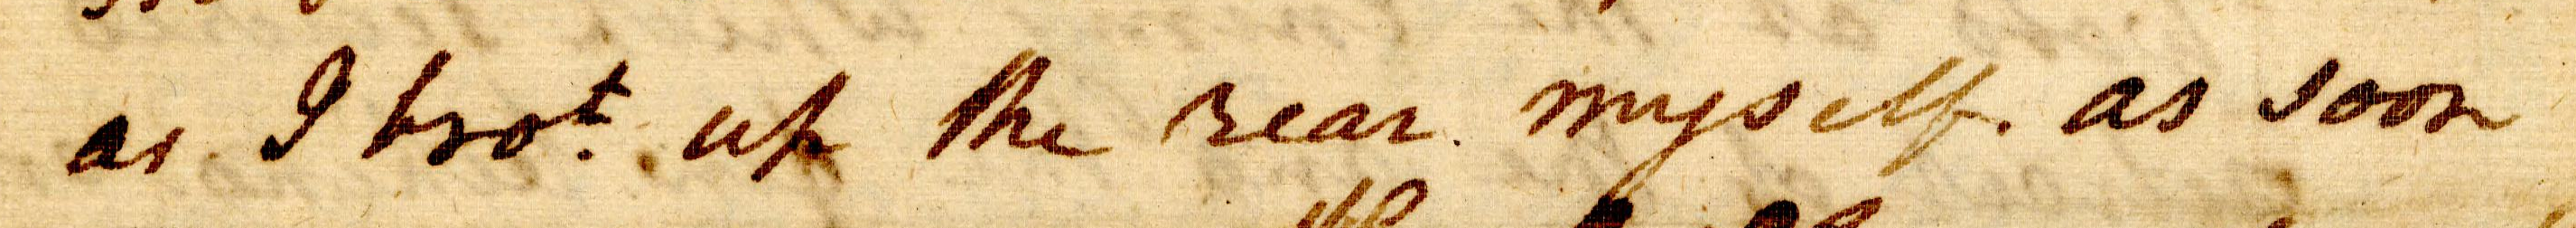as I bro^t. up the rear myself. as soon
